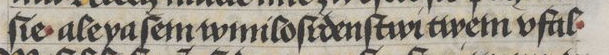ſie.ale ya ſem miloſrdenſtwí twem ufal.
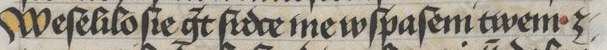Weſelilo ſe ḡt ſrdce me wſpaſeni twem.z¬
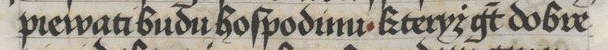piewati budu hoſpodinu.kteryż ḡt dobré
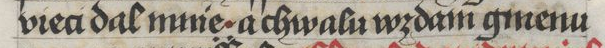vieci dal mnie.a chwalu wzdam gmenu
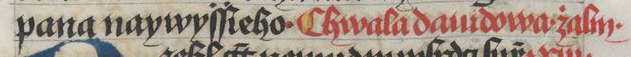pana naywyẛẛieho.Chwala davidowa.żalm.
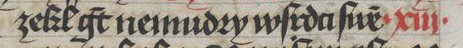zekl ḡt nemudzy w ſrdci ſwē.xiij.
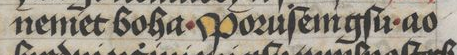neniet boha.Poruẛeni gſu a o¬
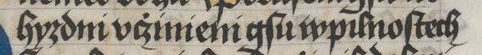hyzdni ucżinieni gſu wpilnoſtech
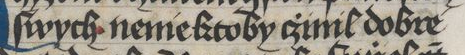ſwych.nenie ktoby cżinil dobré
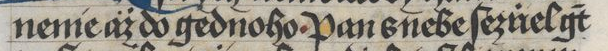neníe aż do gednoho.Pan s nebe ſezṙiel ḡt
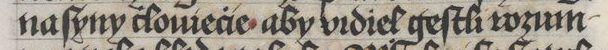na ſyny ċlowieċíe.aby vidiel geſtli rozum¬
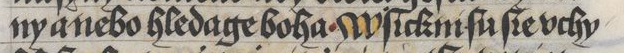ny a nebo hledage boha.Wẛickni u ſie uchy¬
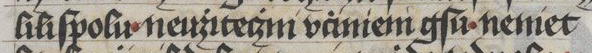lili ſpolu.neużitecżni uċiniem gſu.nemiet
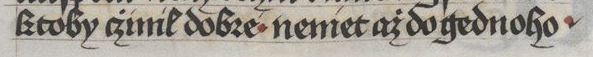ktoby cżinil dobré.neníet aż do gednoho.
